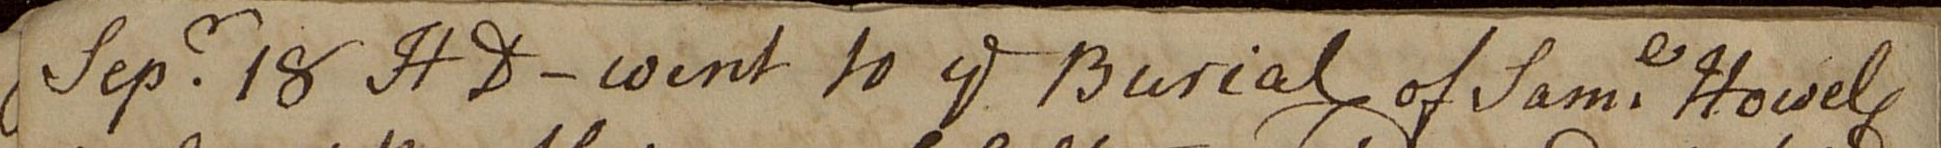Sep^r. 18 HD- went to y^e Burial of Sam^l Howel
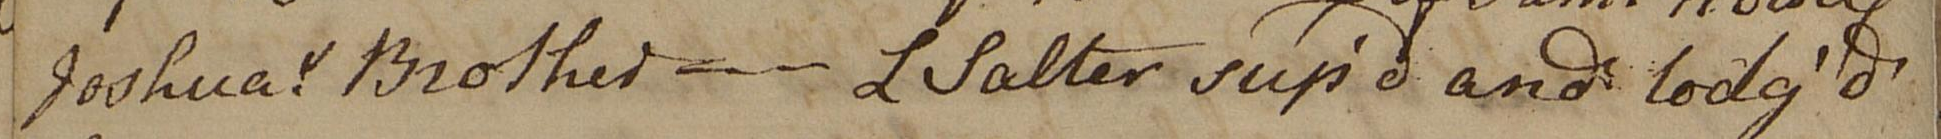Joshua^s Brother- L Salter sup'd and lodg' d
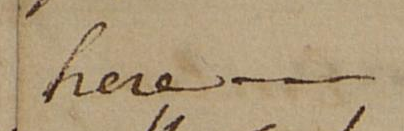here-
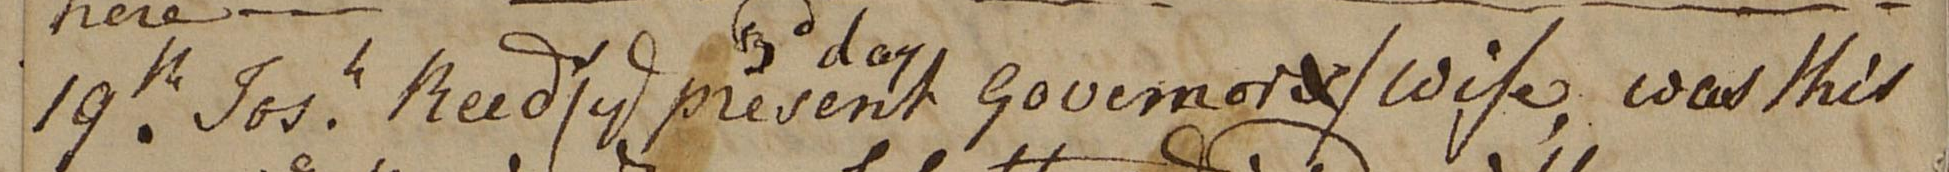19^th. Jos^h. Reed^s /y^e present Governors/ wife, was this
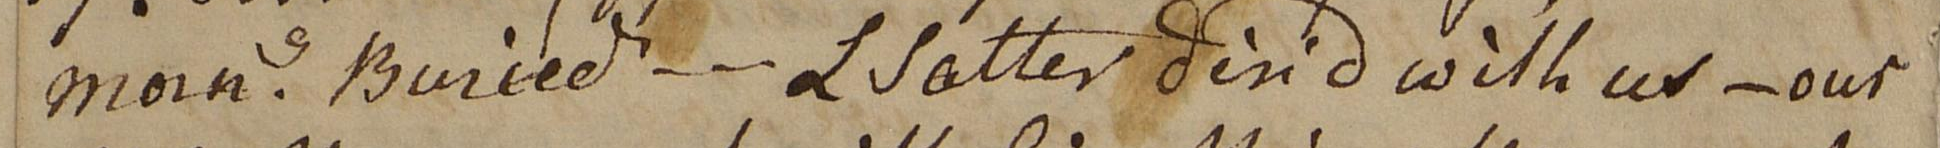morn.^g Buried- L Satter dind with us- our
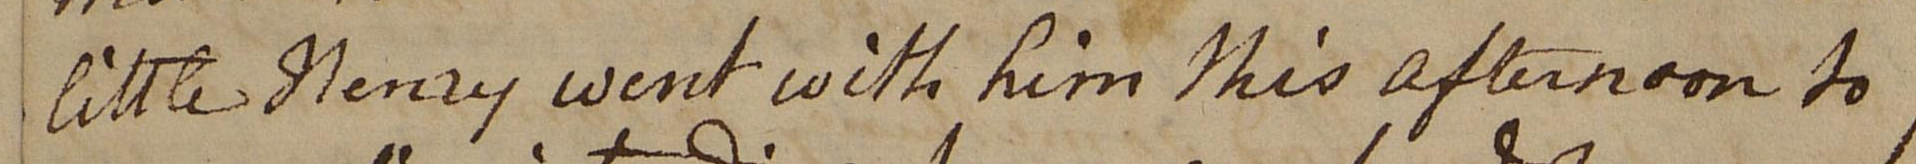little Henry went with him this afternoon to
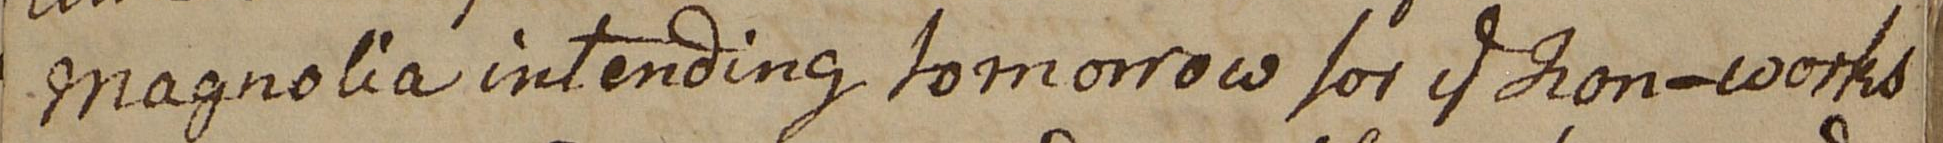Magnolia intending tomorrow for y^e Iron-works
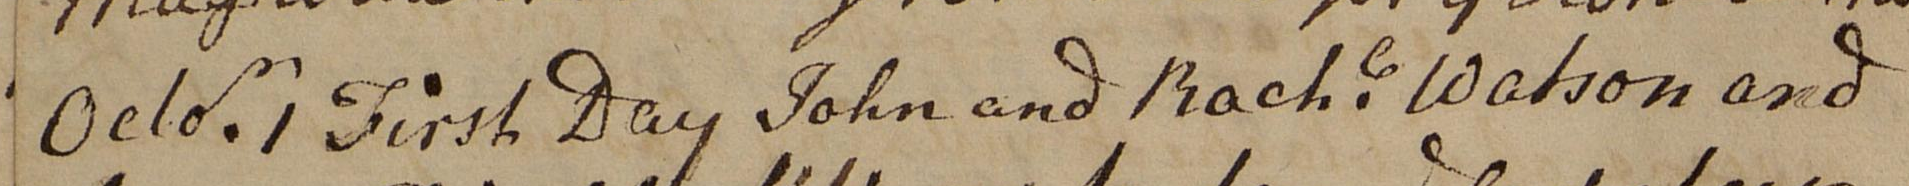Octo^r. 1 First Day John and Rach^l Watson and
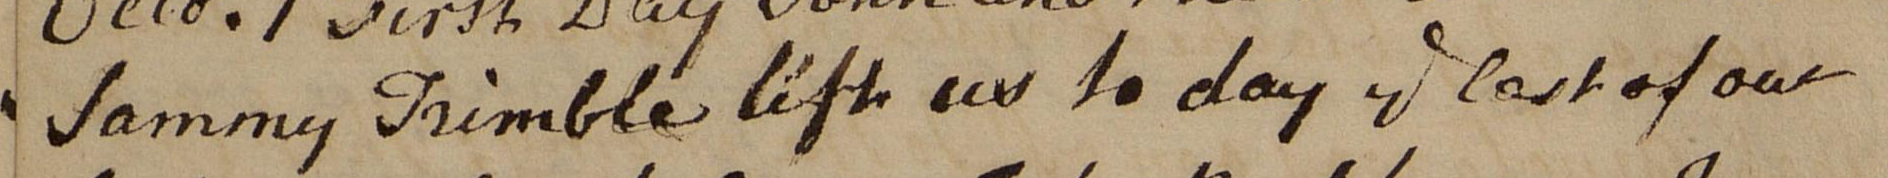Sammy Trimble left us to day y^e last of our
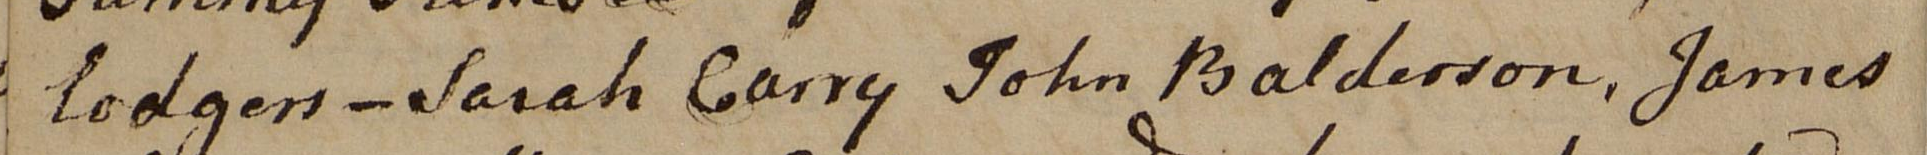lodgers- Sarah Carry John Balderson, James
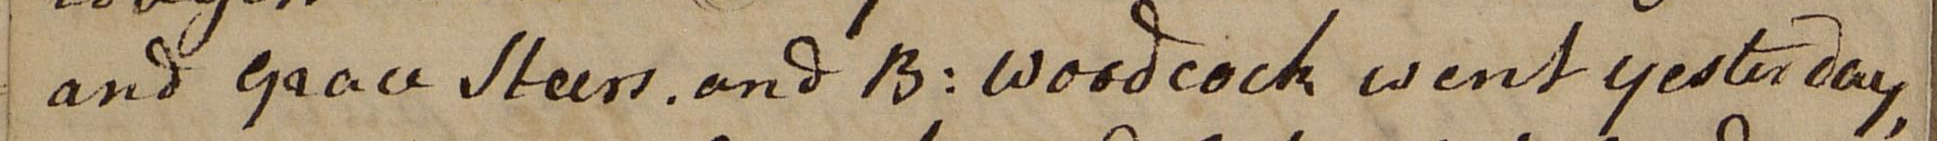and Grace Steers and B: Woodcock went yesterday,
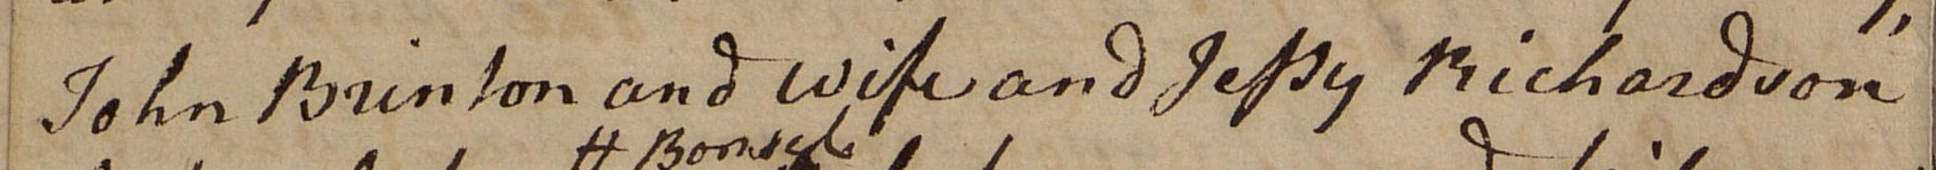John Brinton and wife and Jessy Richardson
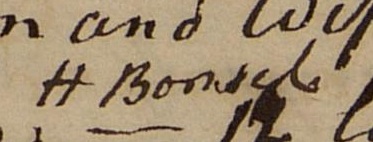H Boorsel
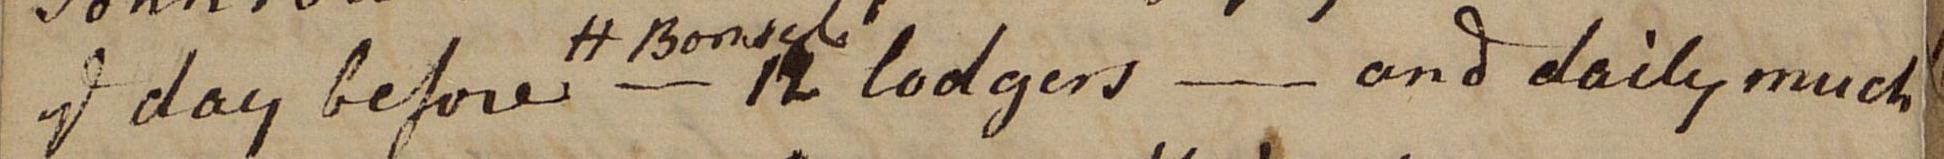y^e day before- 12 lodgers- and daily much
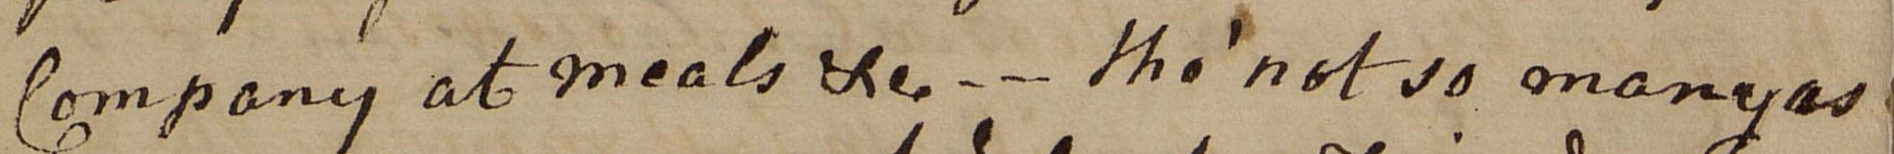Company at meals &c-- tho' not so many as
